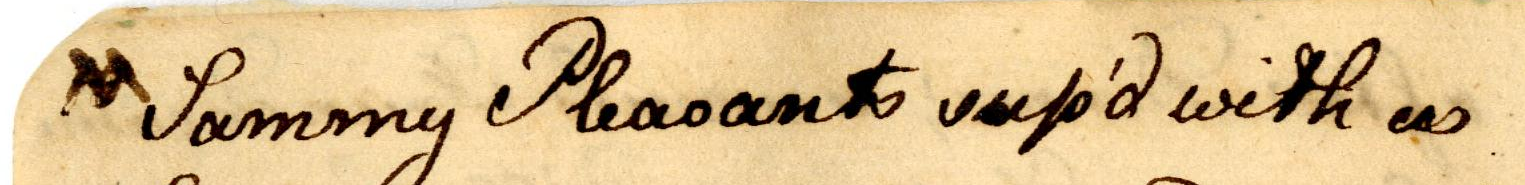Sammy Pleasants sup'd with us
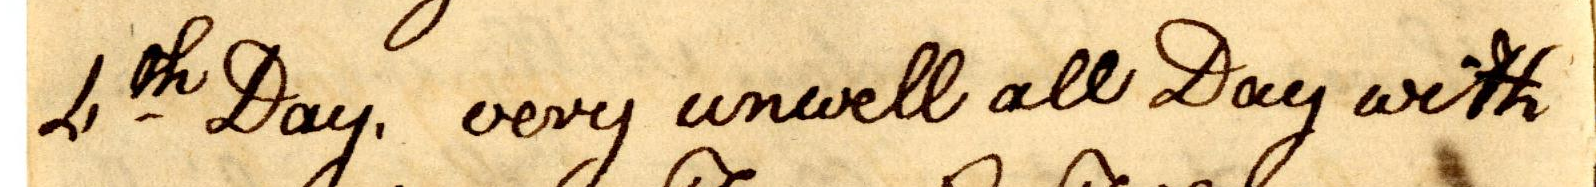4^th Day. very unwell all Day with
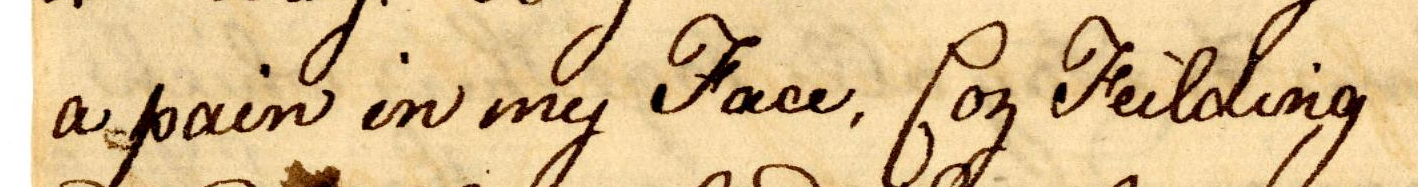a pain in my Face, Coz Feilding
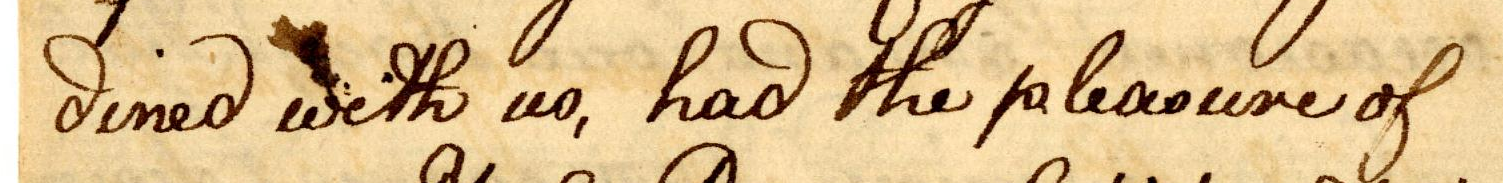dined with us, had the pleasure of
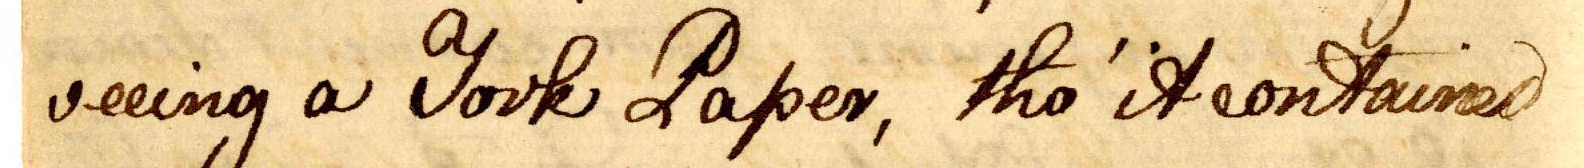seeing a York Paper, tho' it contained
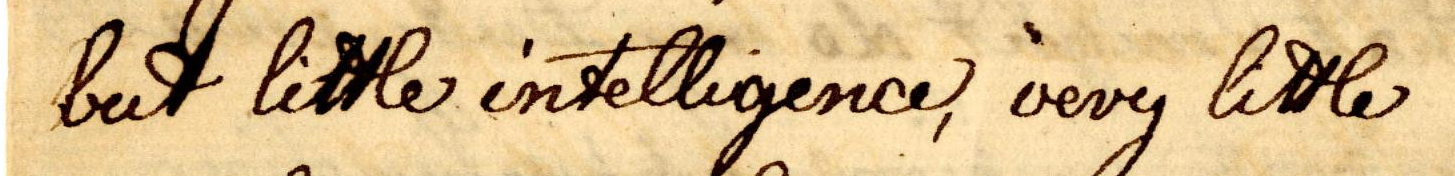but little intelligence, very little
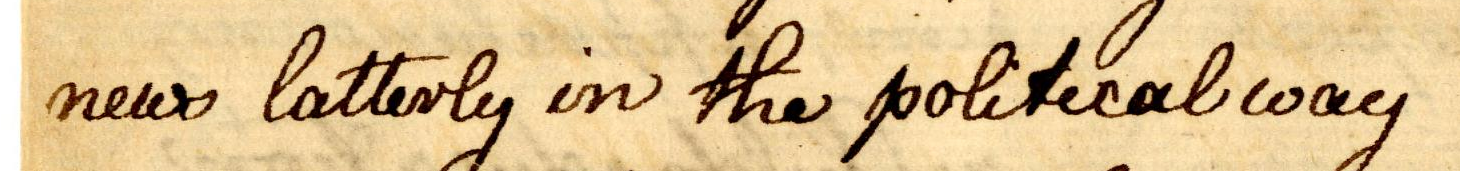news latterly in the political way
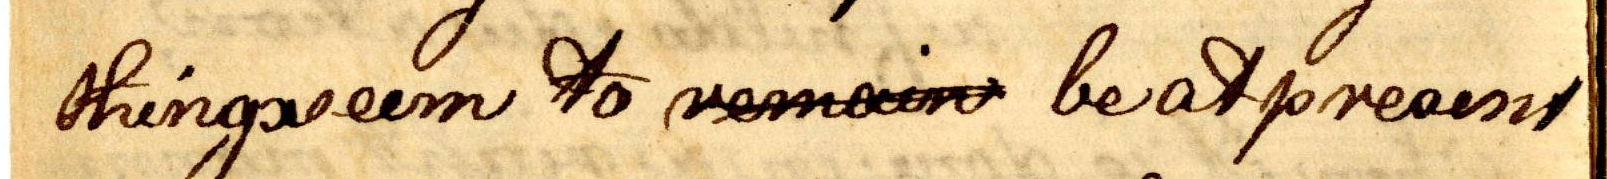things seem to [remain] be at present
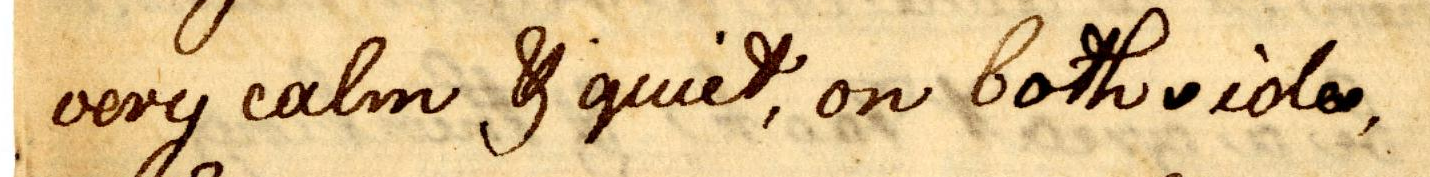very calm & quiet, on both sides,
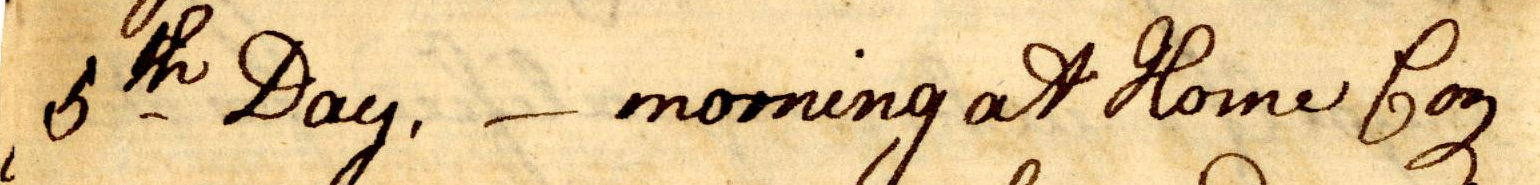5^th Day.- morning at Home Coz
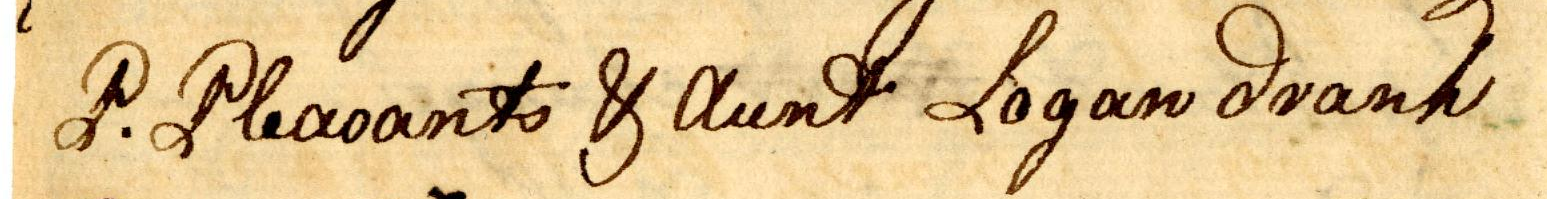P. Pleasants & Aunt Logan drank
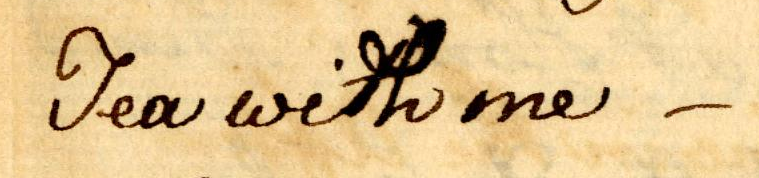Tea with me-
